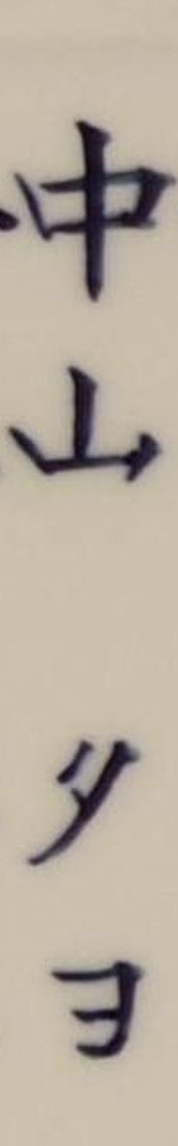中山タヨ
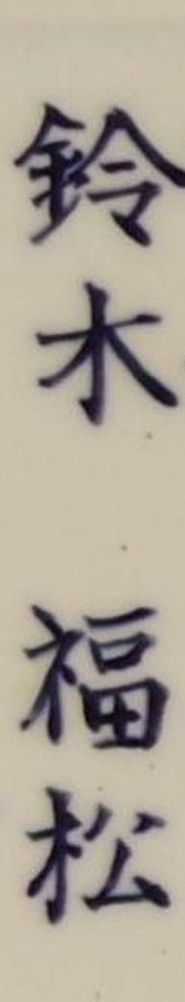鈴木福松
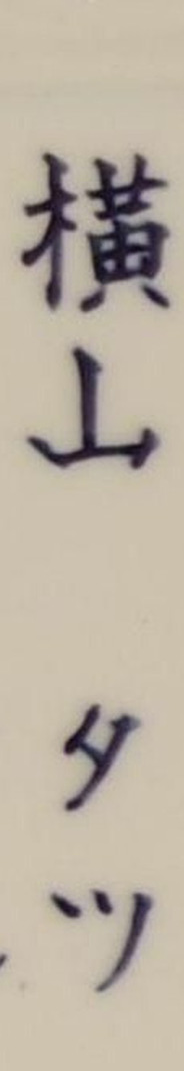横山タツ
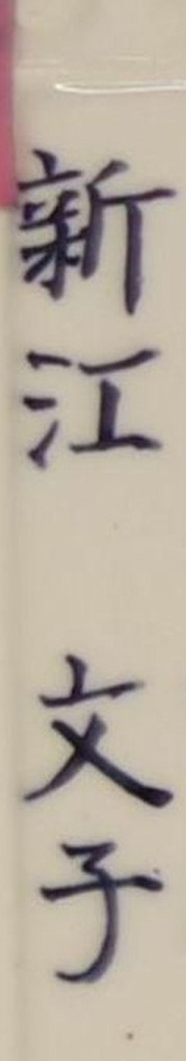新江文子

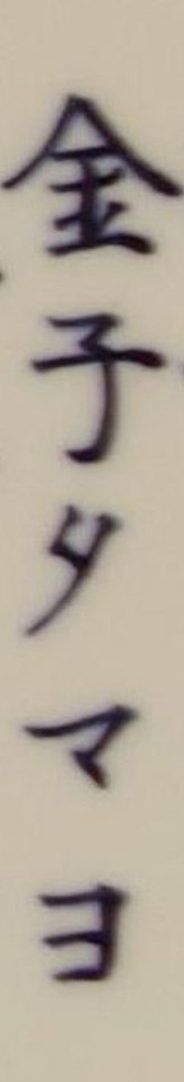金子タマヨ
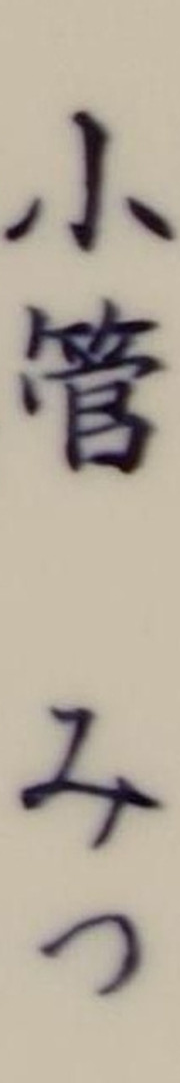小管みつ
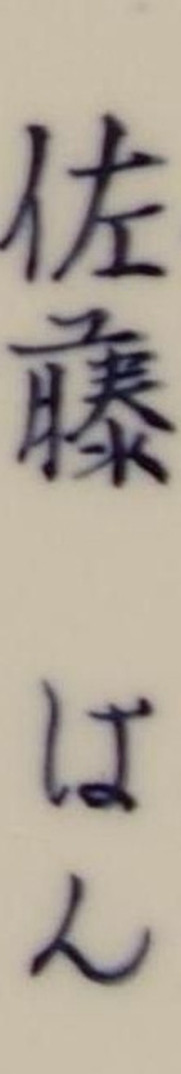佐藤はん
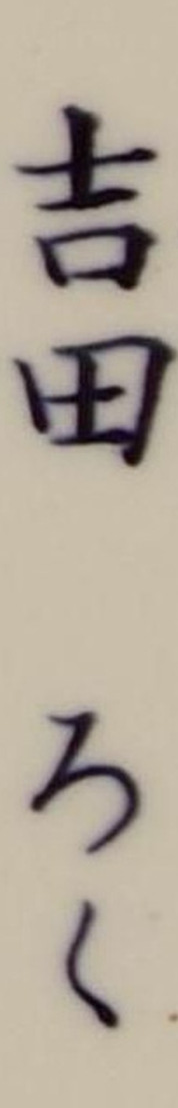吉田ろく
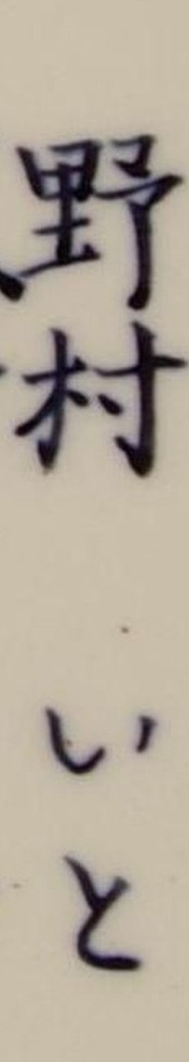野村いと
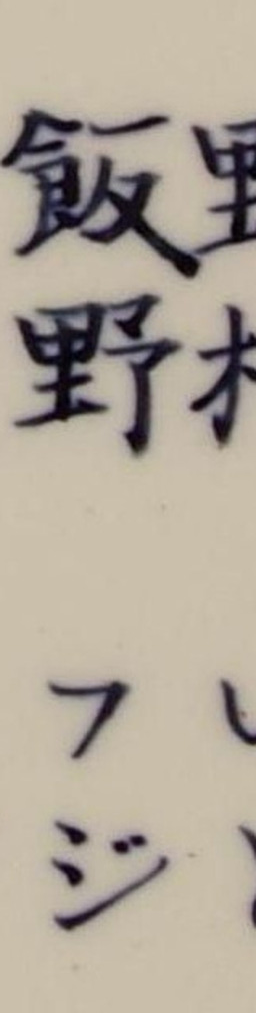飯野フジ
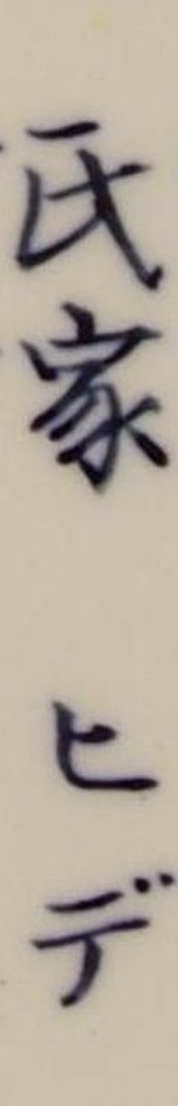氏家ヒデ
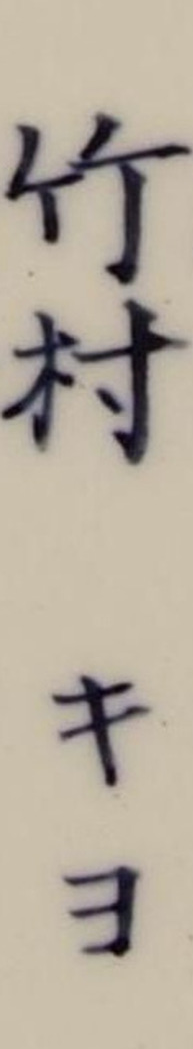竹村キヨ
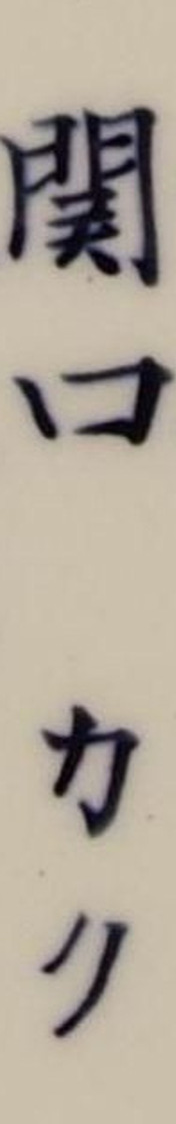関口カク
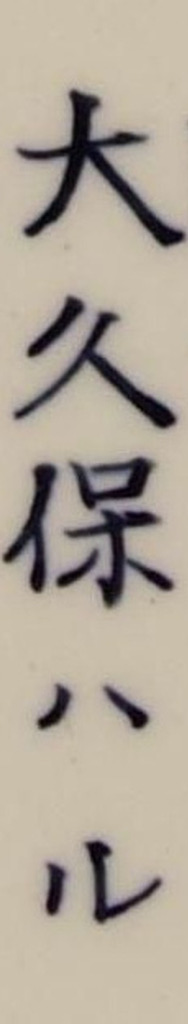大久保ハル
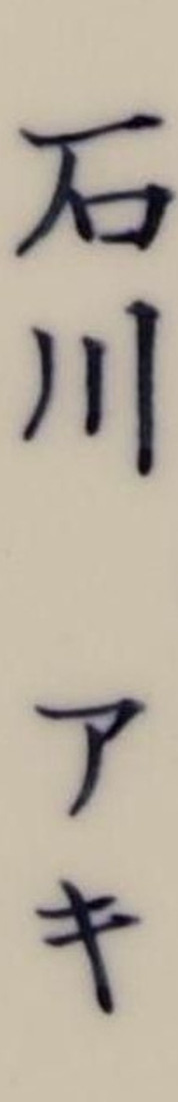石川アキ
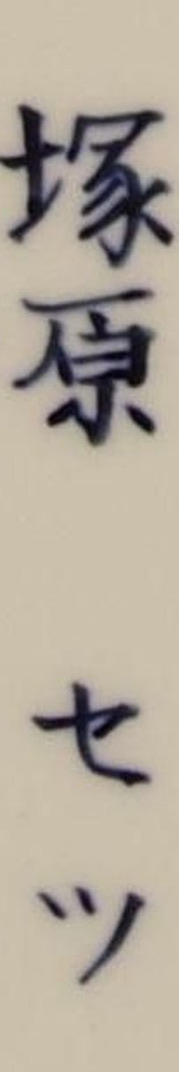塚原セツ
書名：M~S
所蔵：高野山金剛峯寺
